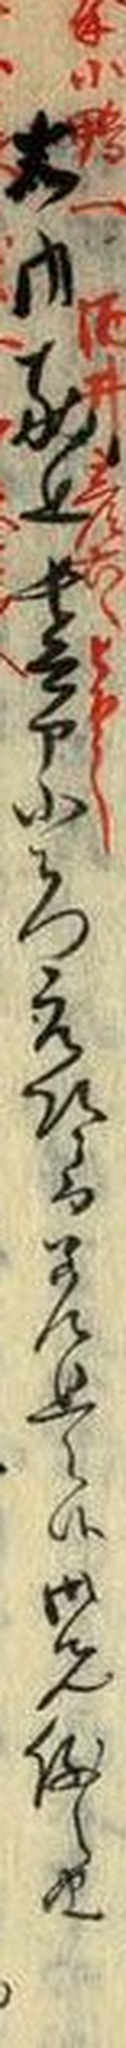右内献上長谷部小右衛門取次ニ而差上之候御先例之由
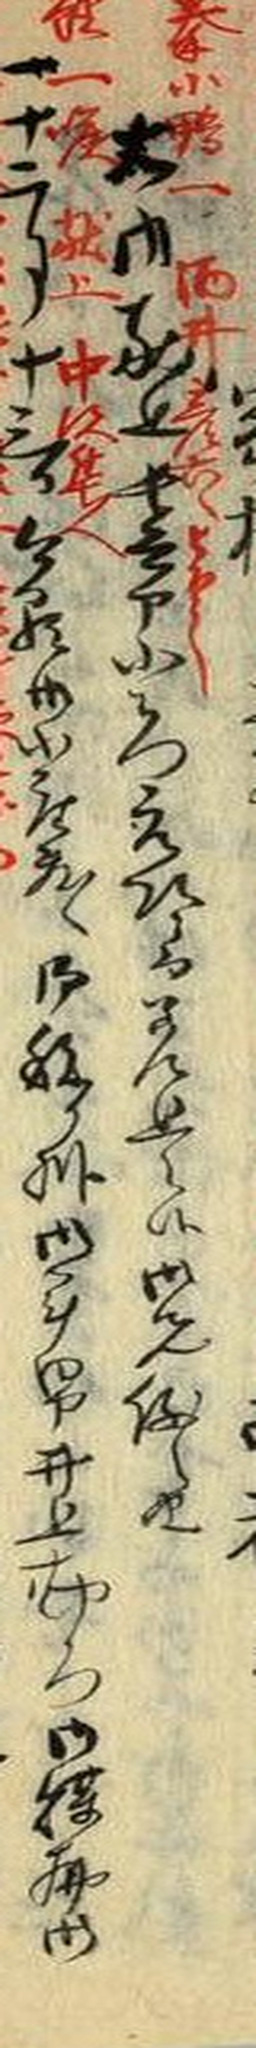一十二月十三日今朝御小座敷へ御移り掛御年男井上勘右衛門御煤払御
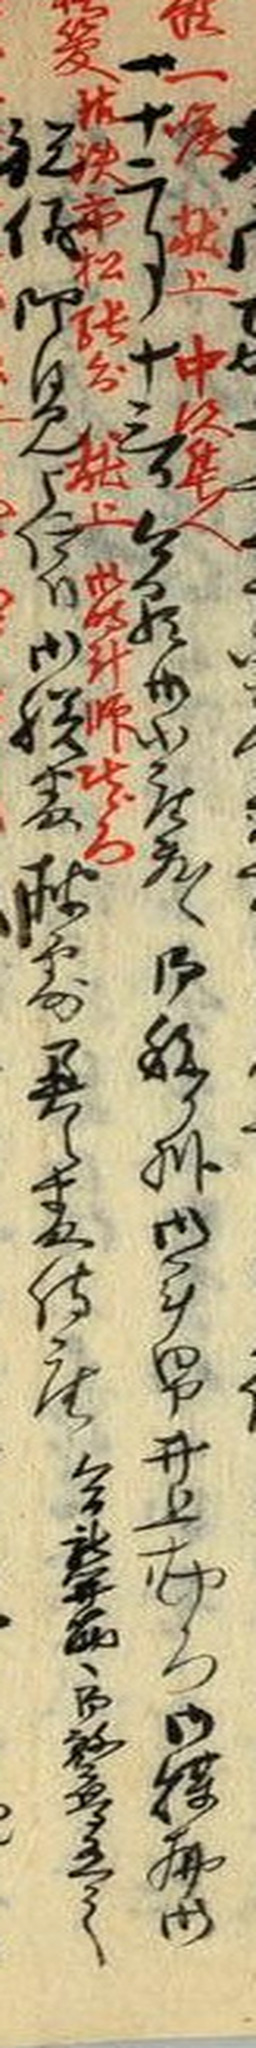祝儀御目見被仰付御膳番披露奥之番侍座今日新開筋へ御放鷹有之
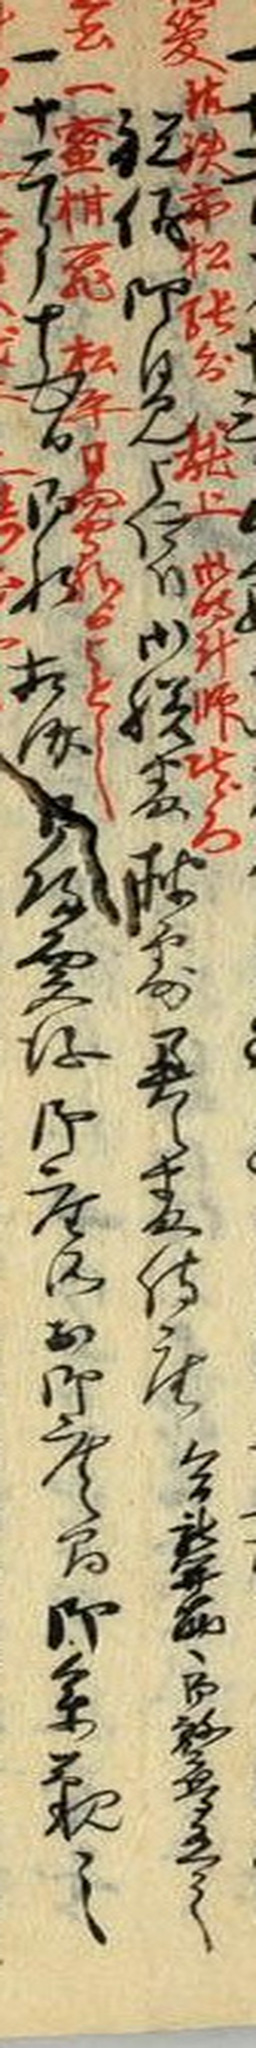一十二月十五日御礼相済御帰殿後御座所於御座之間御参覲之
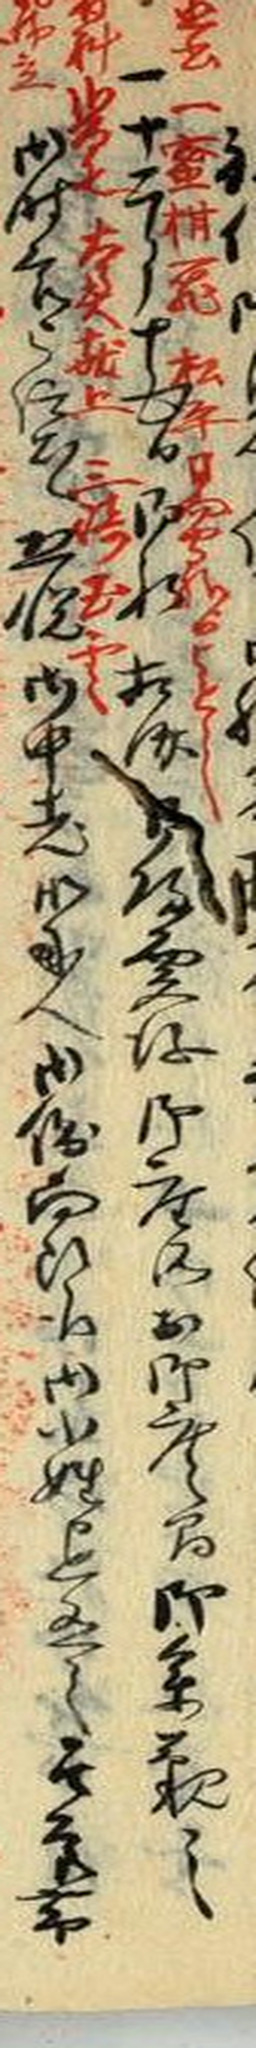御時節被仰出候恐悦御中老御用人御側向頭取御小姓申上有之其節帯
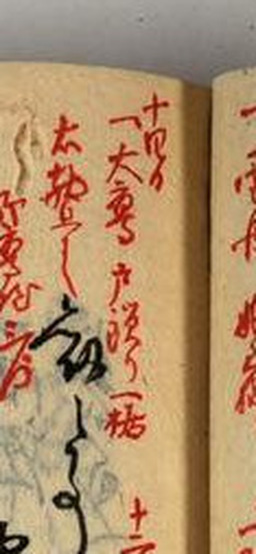一大鷹戸鎖り一据
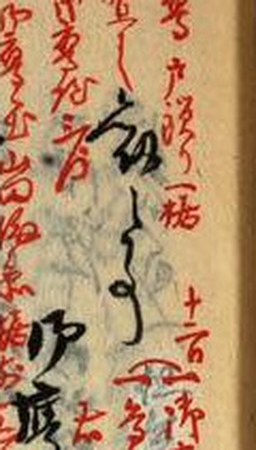剣之事
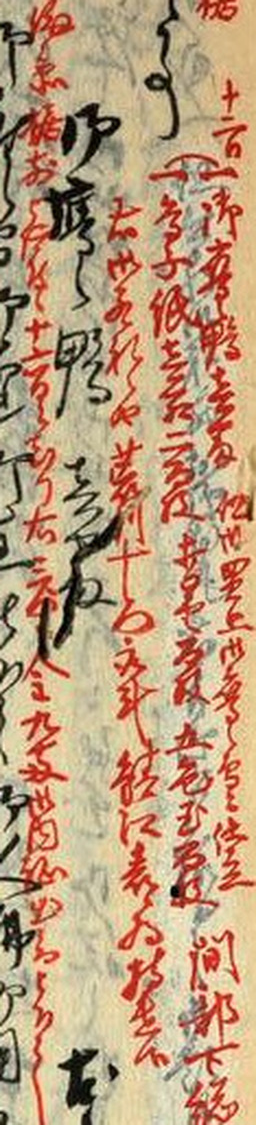右御答礼之由荒川十右衛門取計鯖江表へ為持遣候
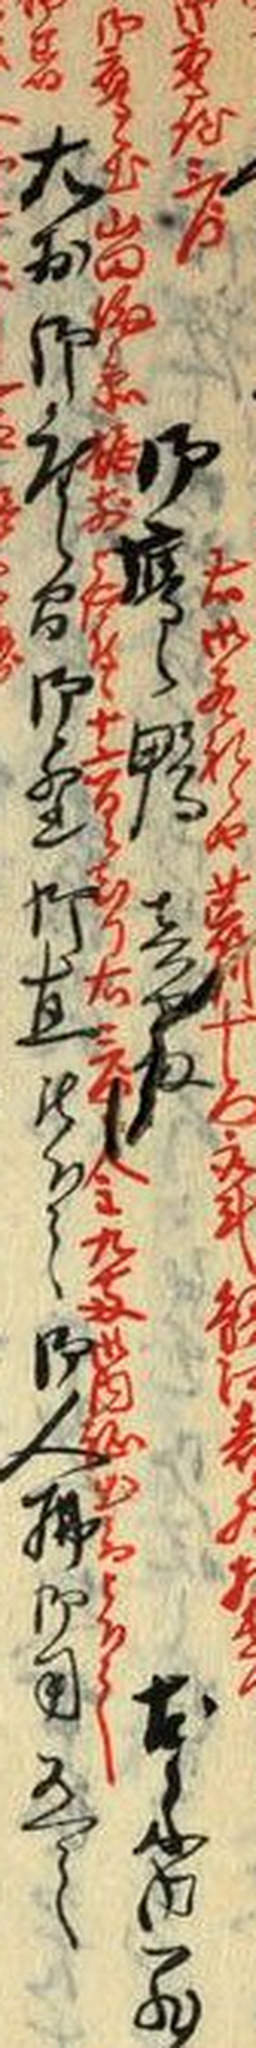右於御座之間御逢御直被下之御人払御用有之
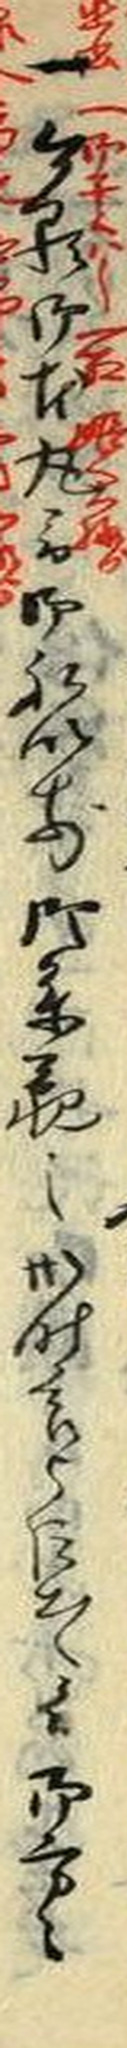一今朝御本丸ニ而御礼以前御参覲之御時節被仰出候ニ付御方々
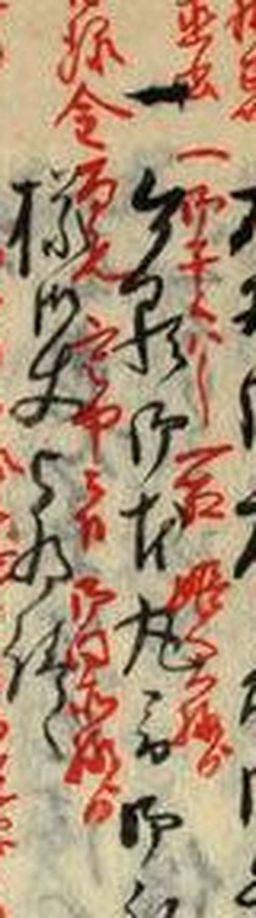様御使被為請候
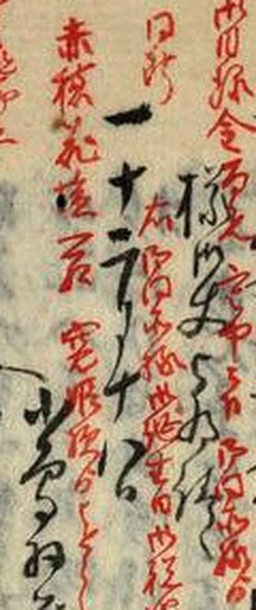一十二月十八日
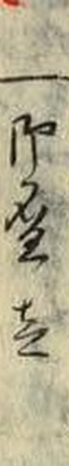御盃壱
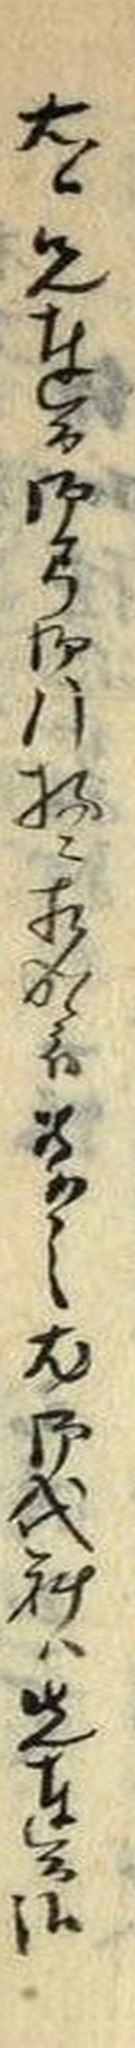右ハ先達而御弓御引揚ニ相成候ニ付被下之尤御代料ハ先達而銀
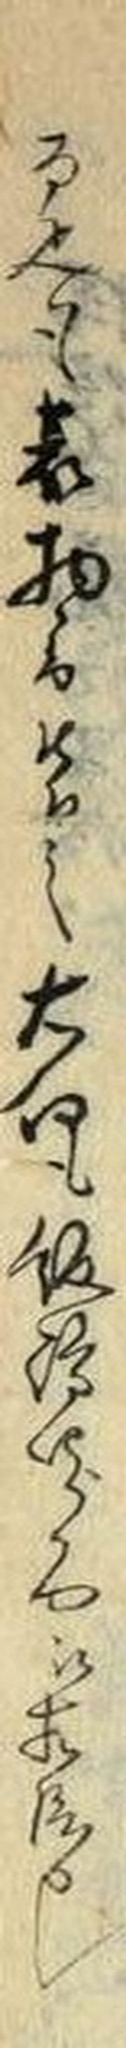百疋ツヽ表物ニ而被下之右何も飯嶋四郎右衛門江相渡申候

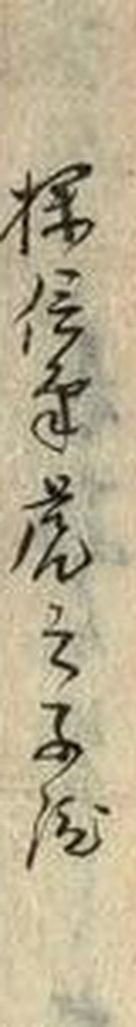探信筆虎之子渡
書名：少傅日録抄（斉承付側向頭取日記、在国）
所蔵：福井県文書館 Fukui Prefectural Archives
